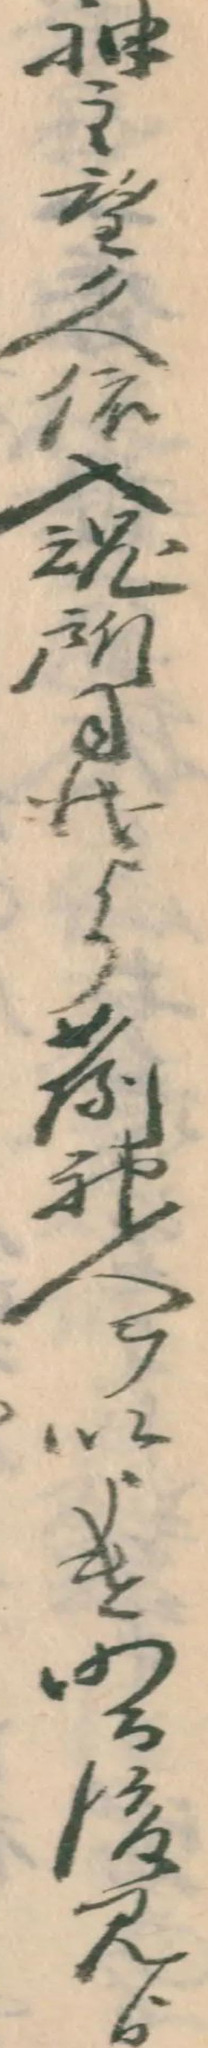神主望久依入魂所司代より如例神人ヲ以申遣仍而後見ゟ
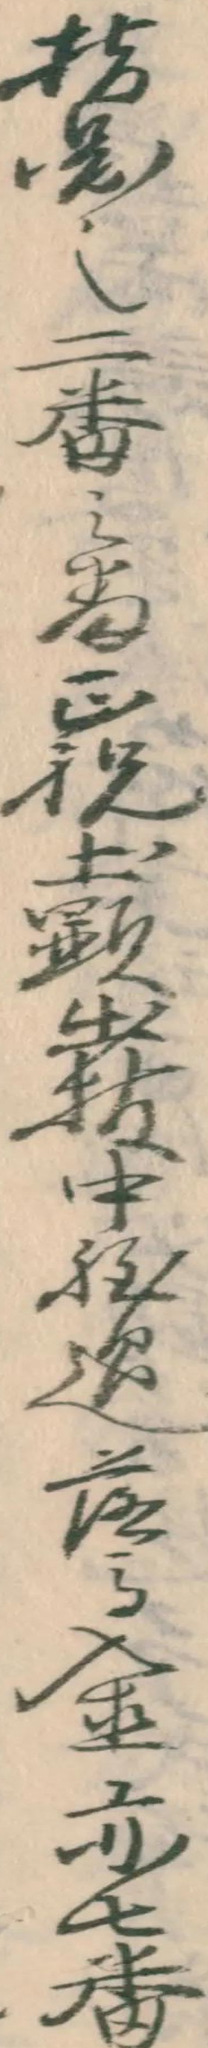指図也二番之番正祝土顕出抜中程過落馬入直亦七番
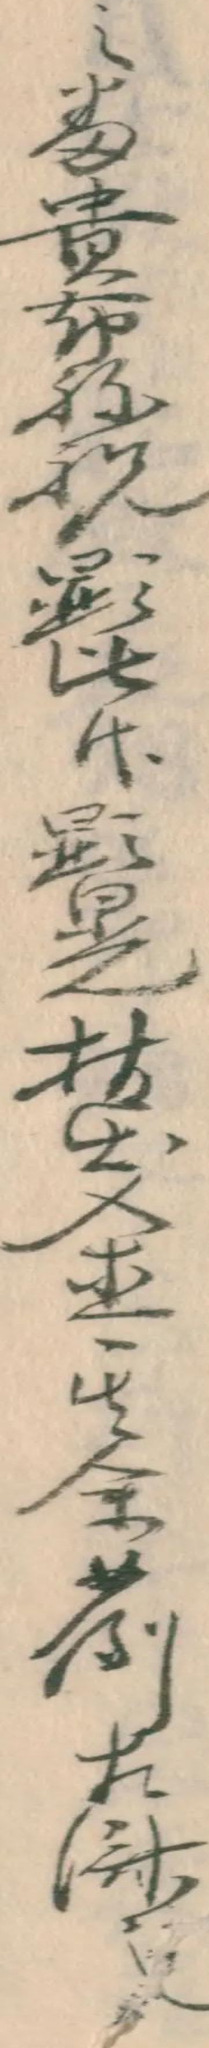之番貴布役祝顕比代顕晃抜出入直其余如例相済也
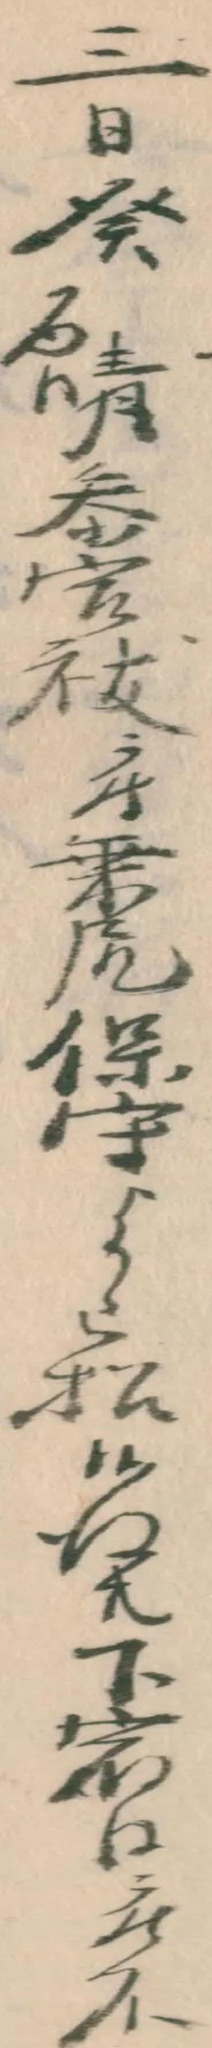三日癸酉晴参宮祓ニ付乗尻保守より招候得共下宿日ニ付不
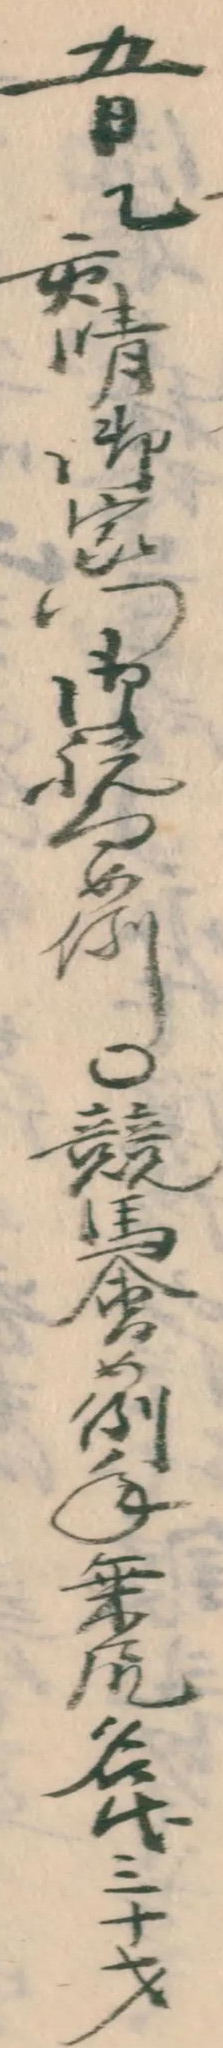五日乙亥晴御室門御祝向如例〇競馬會如例年乗尻名代三十才
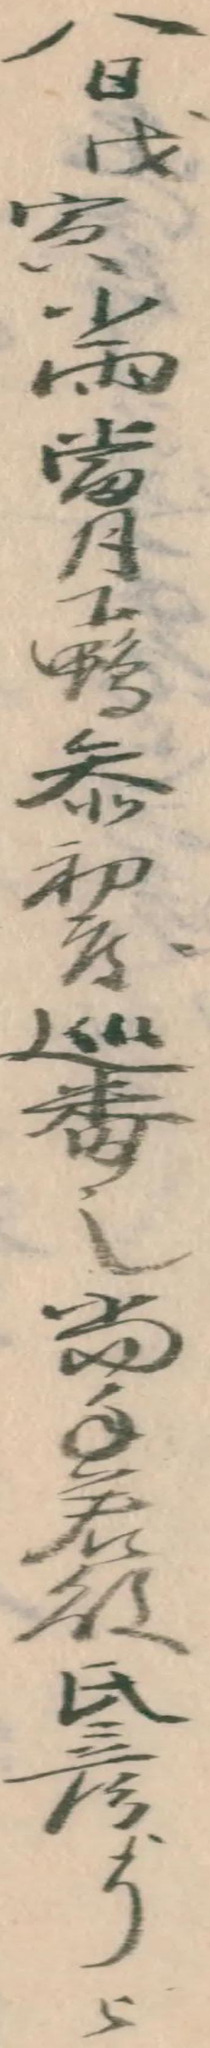八日戊寅小雨當月下鴨参初度巡番也當手若役民彦より被
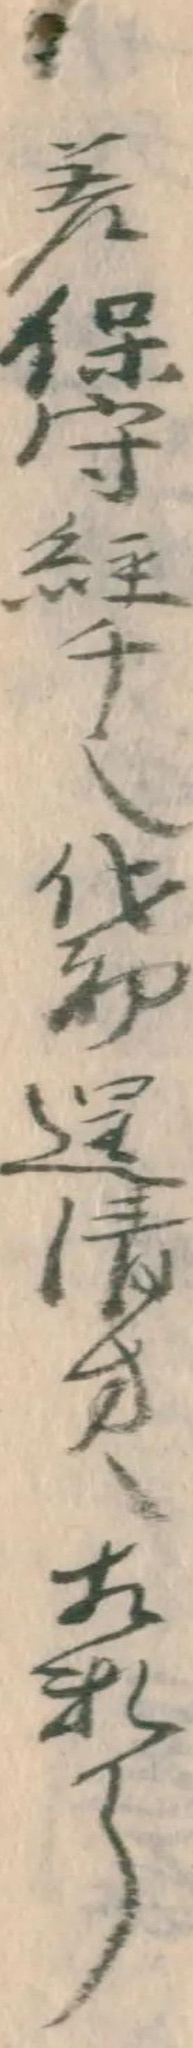差保守経千之代勤逞清方へ相頼了
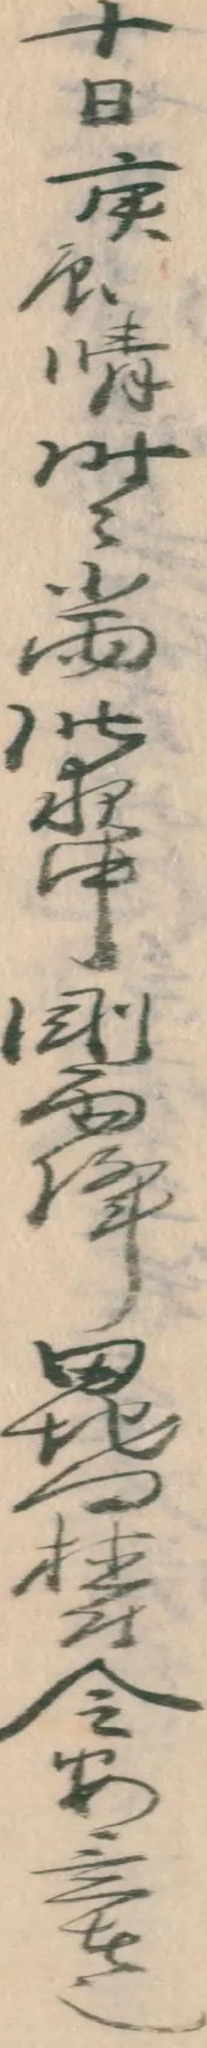十日庚辰晴時々小雨昨夜中剛雨降田地向植付令安意者也
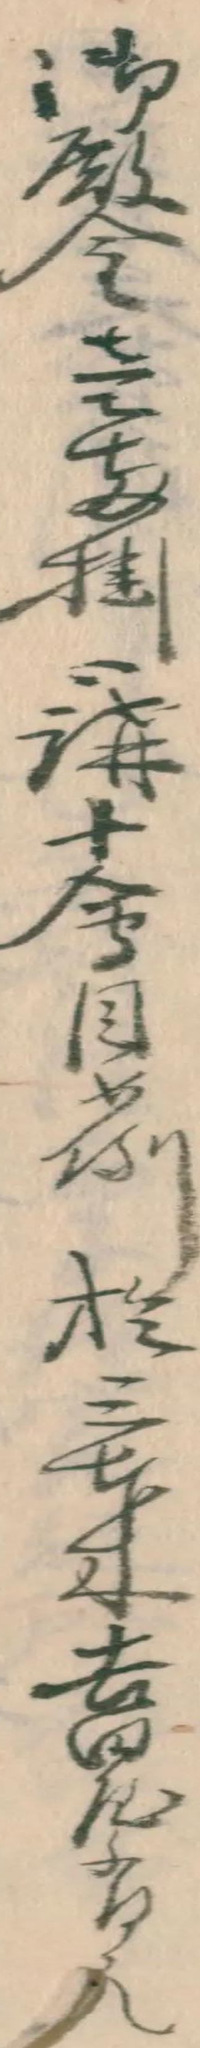御殿金壱両掛御講十會目如例於三本木吉田屋有之
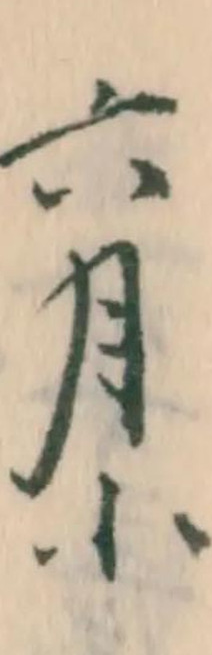六月小
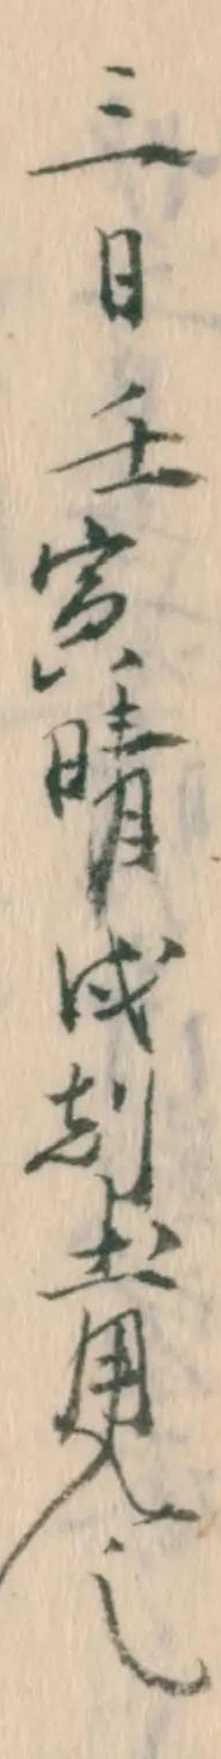三日壬寅晴戌刻土用入也
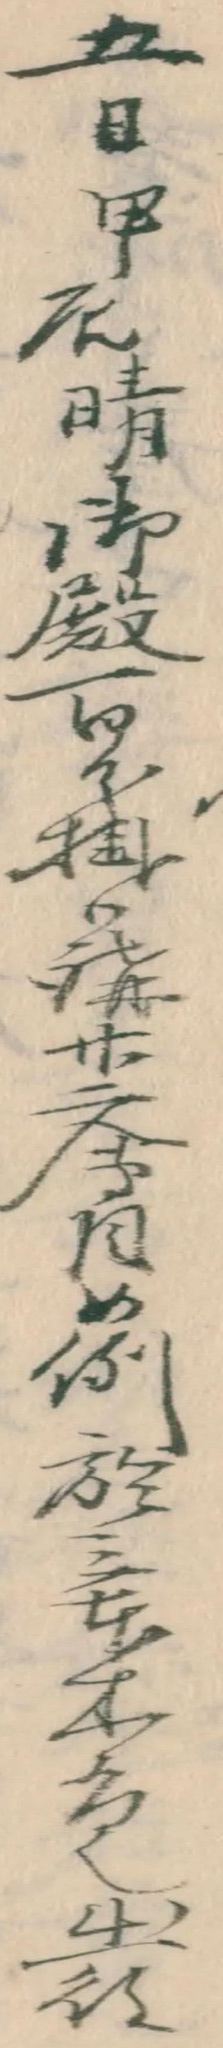五日甲辰晴御殿百掛御構廿二會目如例於三本木有之出役
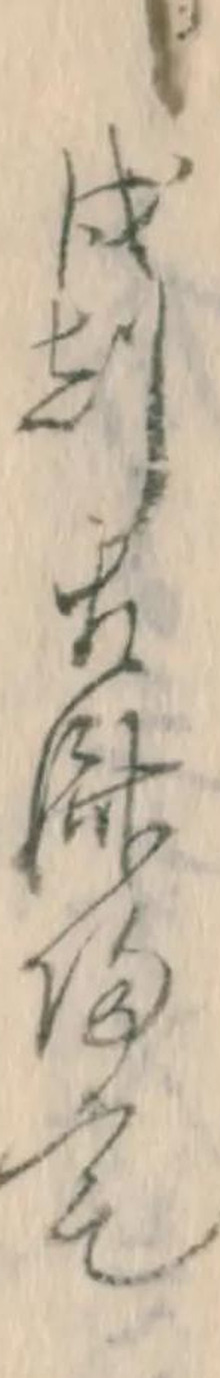戌刻相済帰宅
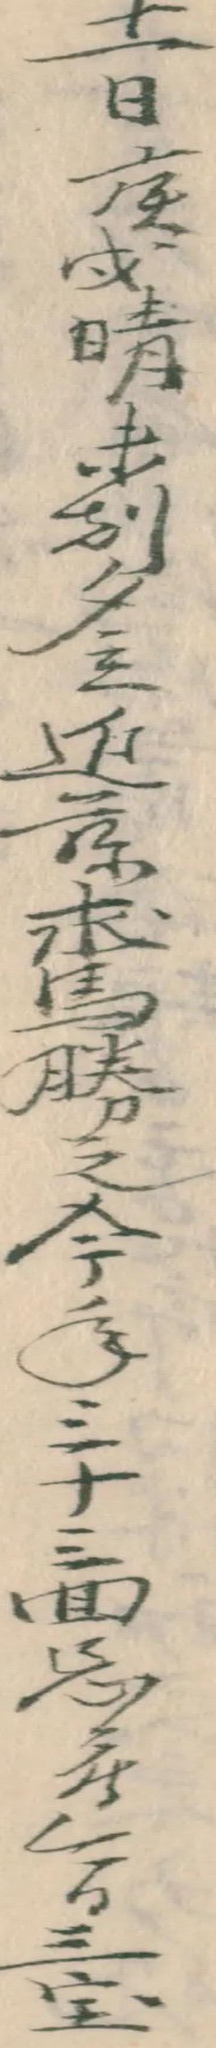十一日庚戌晴未刻夕立近藤求馬勝之今年三十三回忌ニ付今日三宝
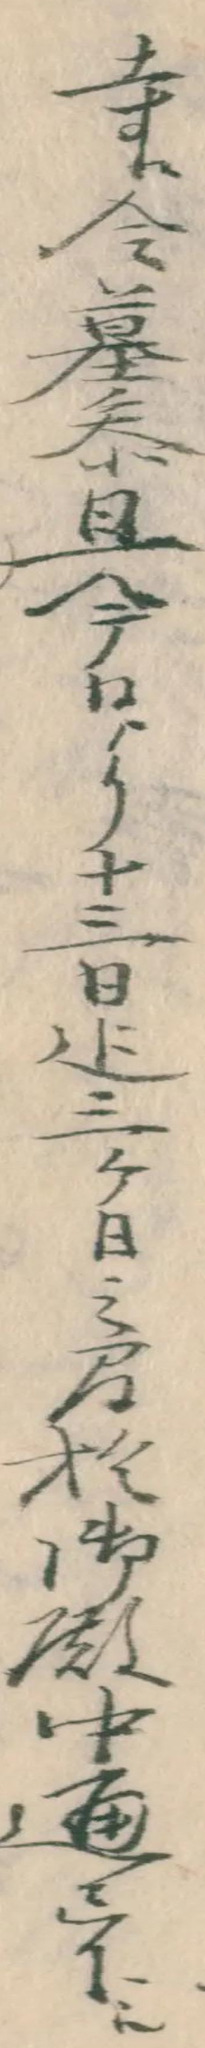寺え令墓参且今日より十三日迄三ヶ日之間於御殿中通已下え
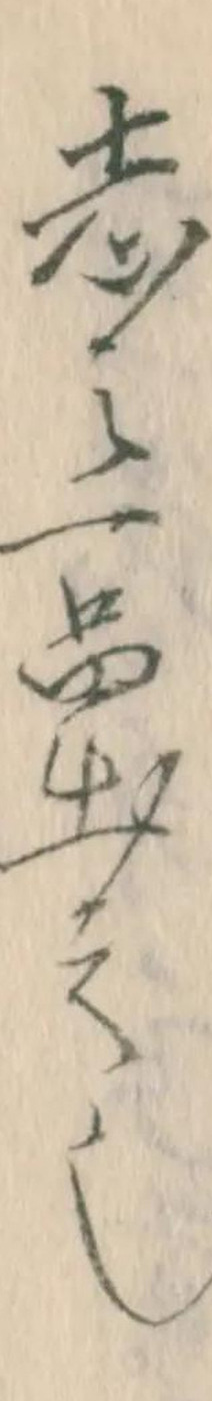志之一品出之也
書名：賀茂社記録. 第66冊
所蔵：国立国会図書館 National Diet Library, JAPAN
